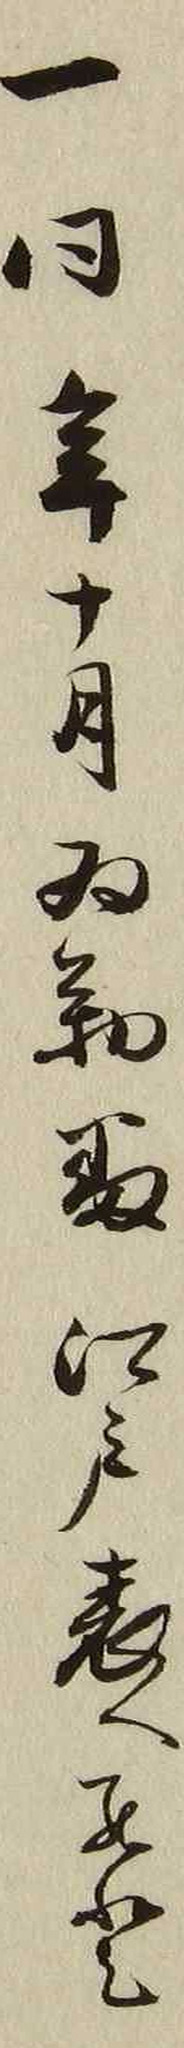一同年十月為勤番江戸表へ罷登
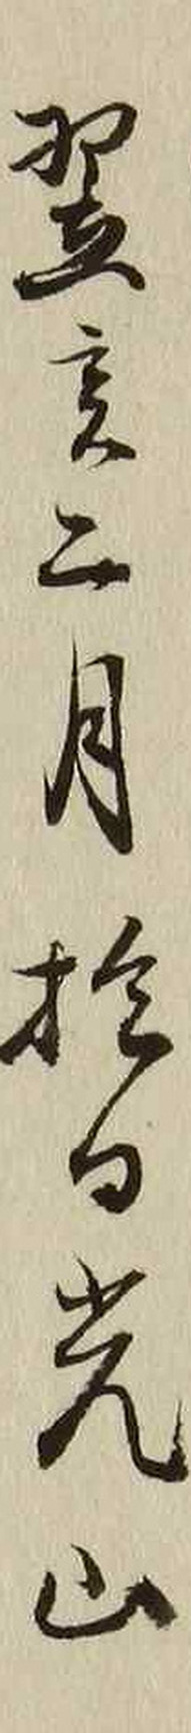翌亥二月於日光山
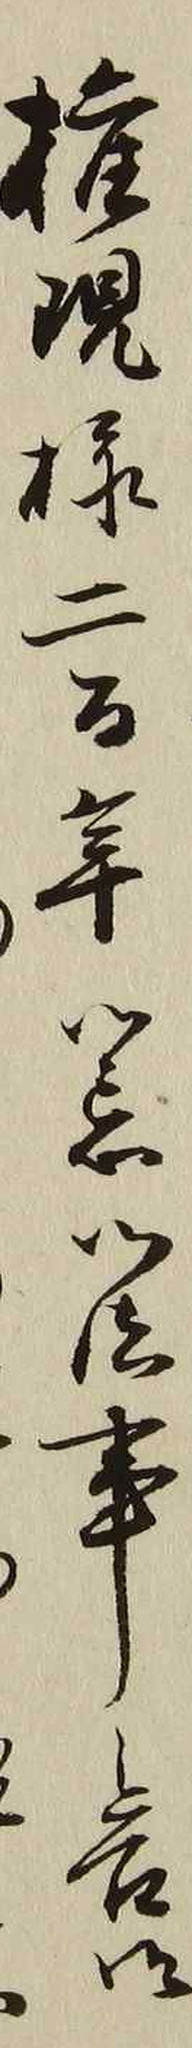権現様二百年御忌御法事之節御
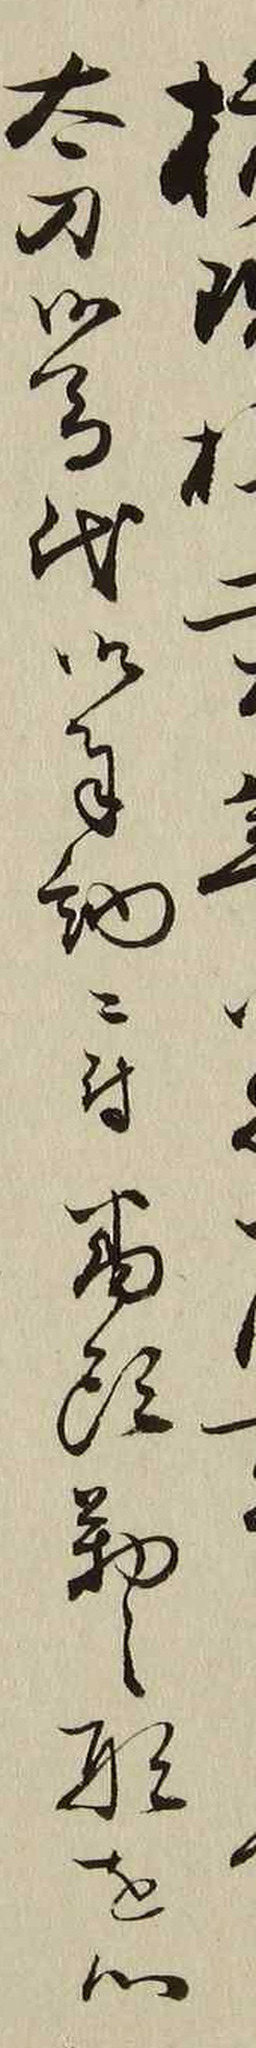太刀御馬代御奉納に付番頭勤之形を以
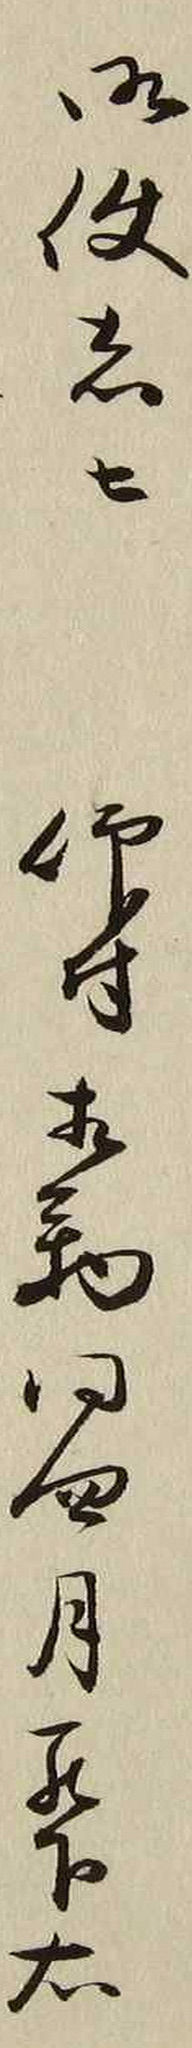御使者被仰付相勤同四月罷下右
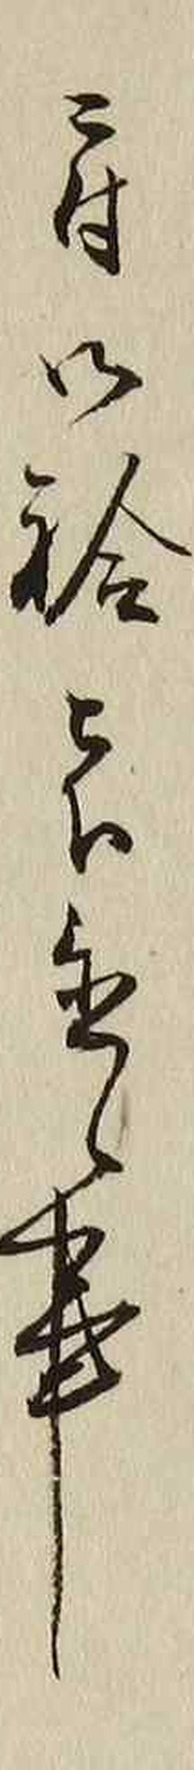に付御袷被下置候事
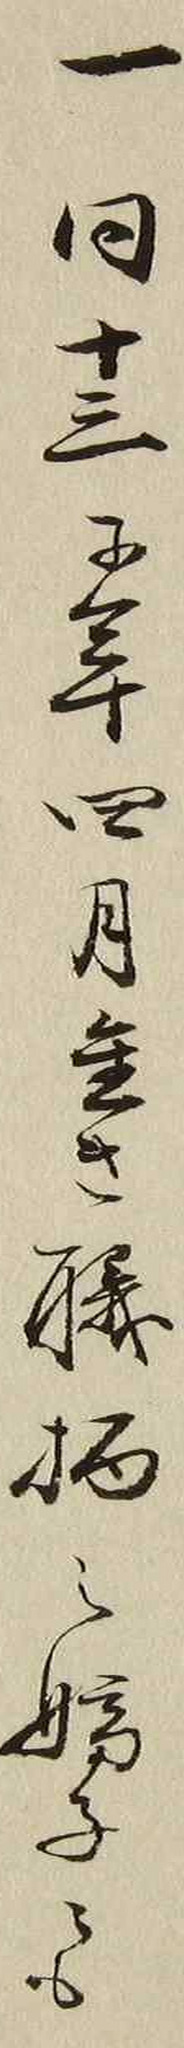一同十三子年四月重き職柄之嫡子にも
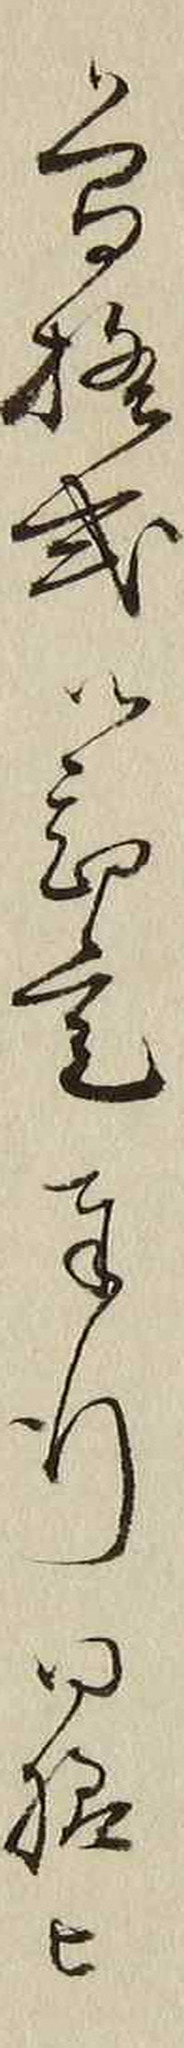候間格式は勘定奉行同様被
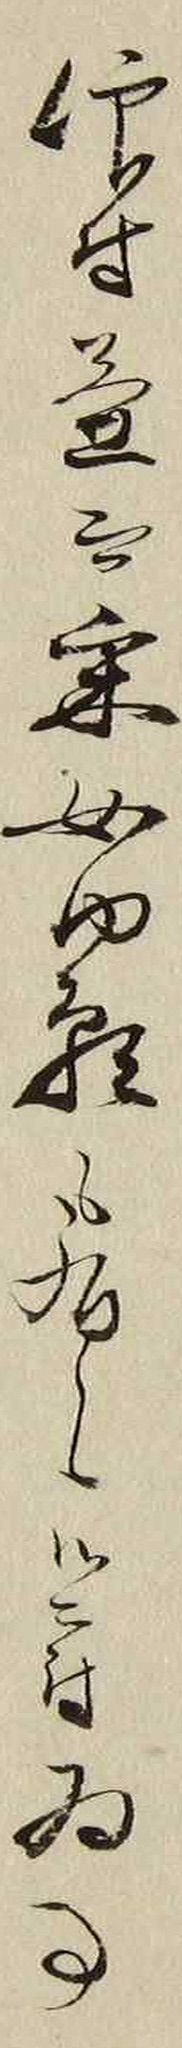仰付兼而采女内願も有之候に付為事
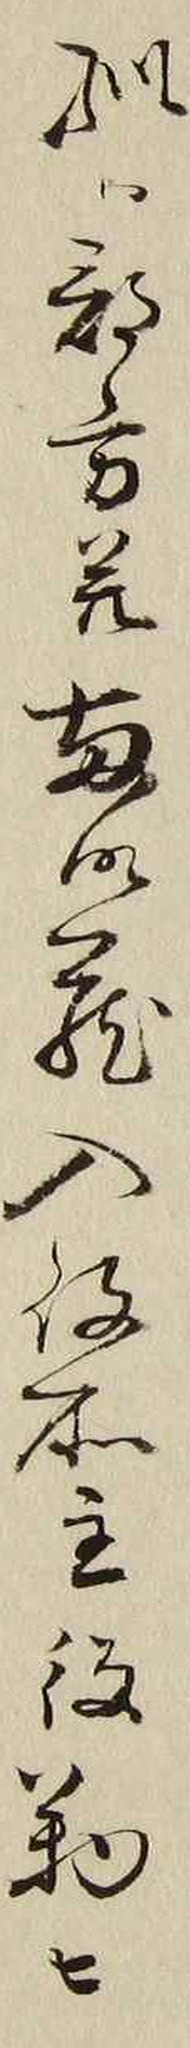馴候部方并両御蔵入役所主役勤被
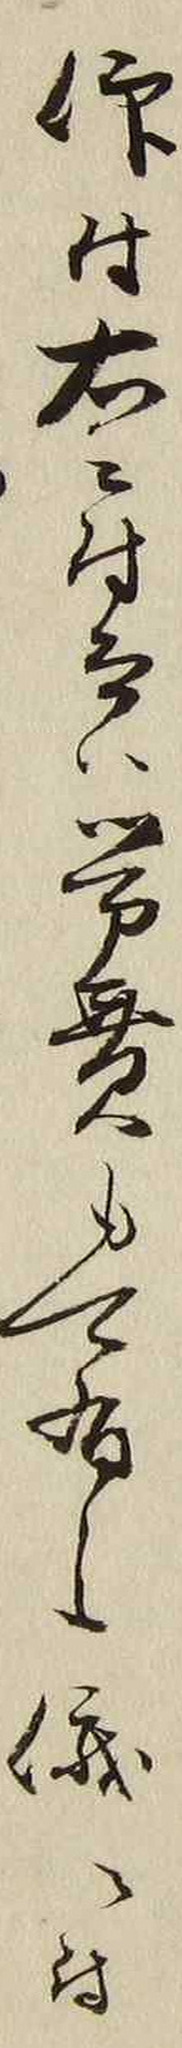仰付右に付而は労費も可有之儀に付
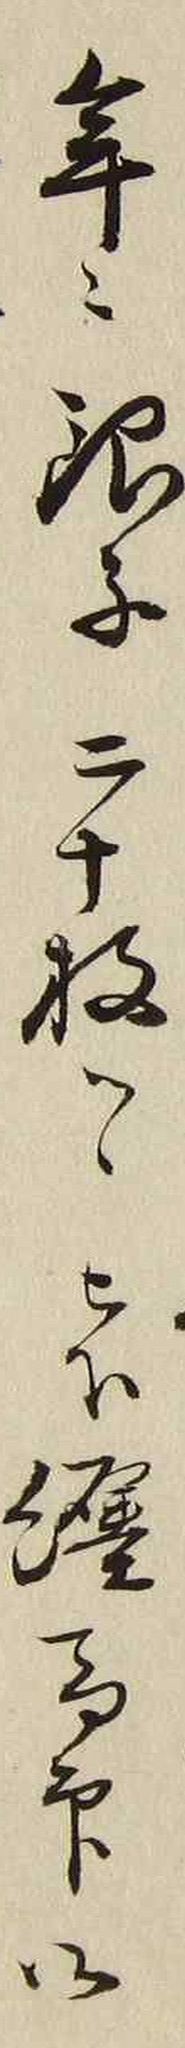年々銀子二十枚つゝ被下纏馬印御
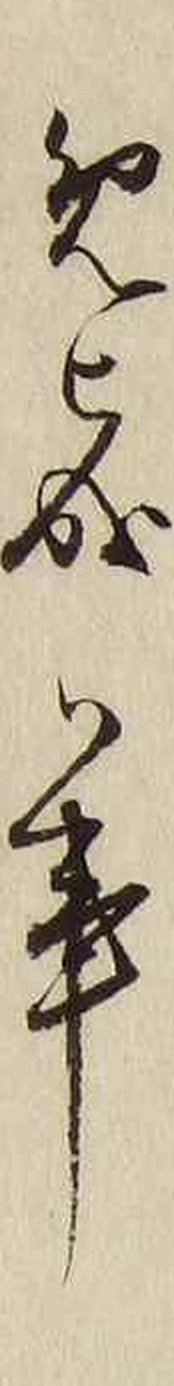免被成候事
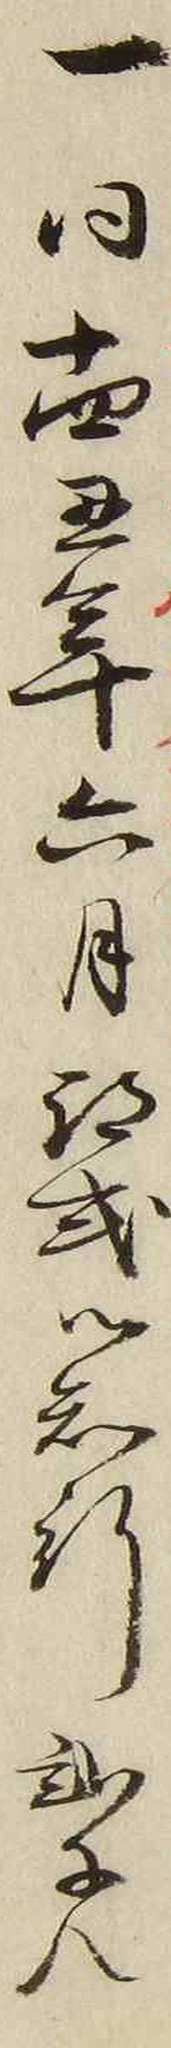一同十四丑年六月跡式御知行弐千八

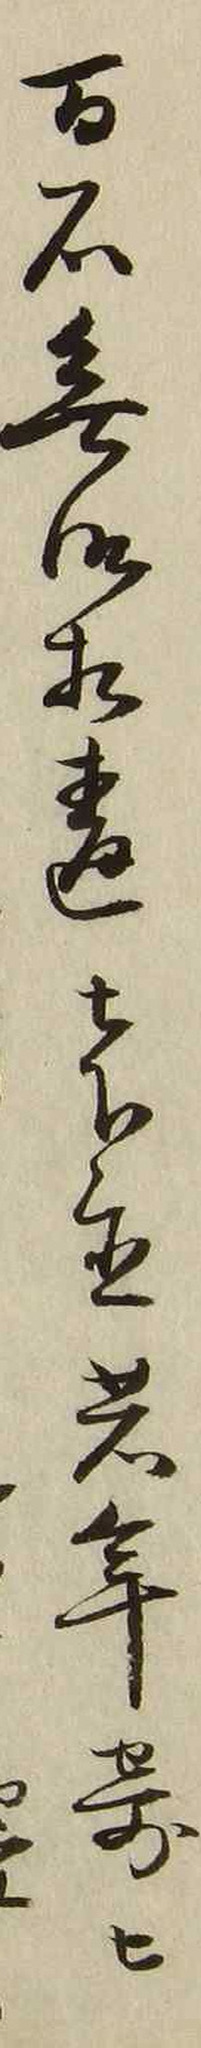百石無御相違被下置若年寄被
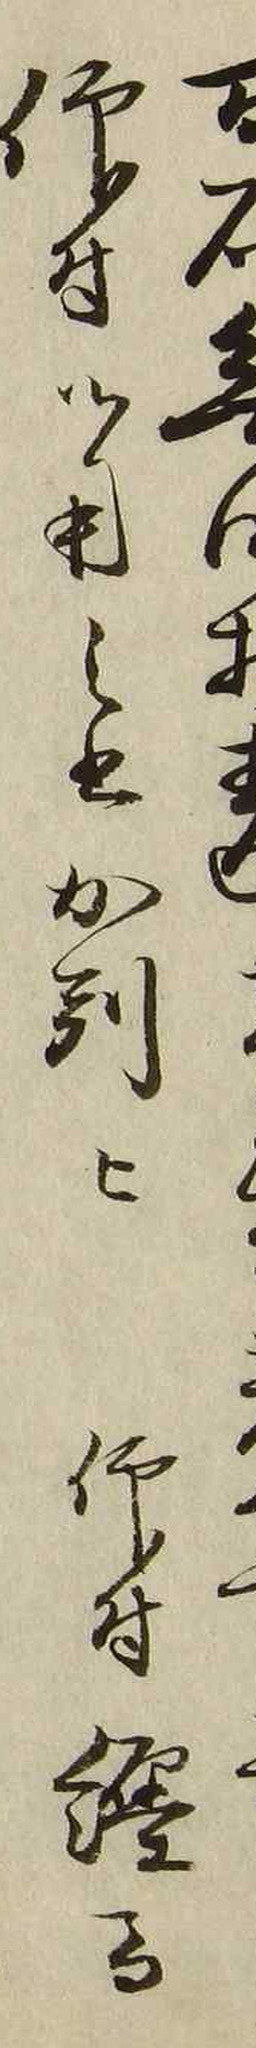仰付御用之書加判被仰付纏馬
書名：諸士系譜　巻之292　き之部1
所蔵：会津若松市立会津図書館
